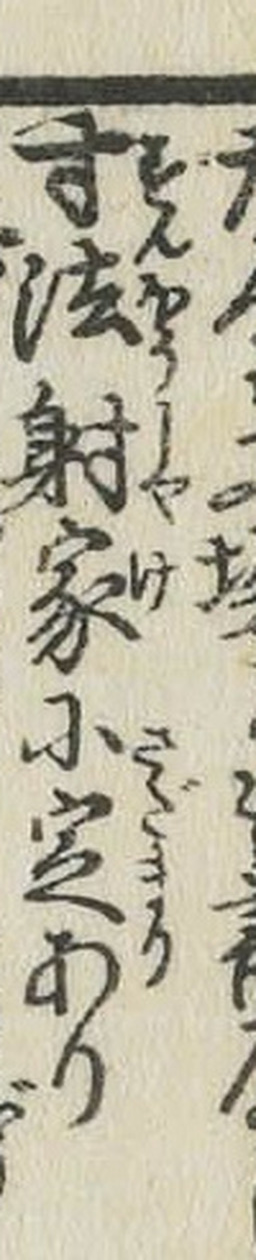寸法射家に定あり
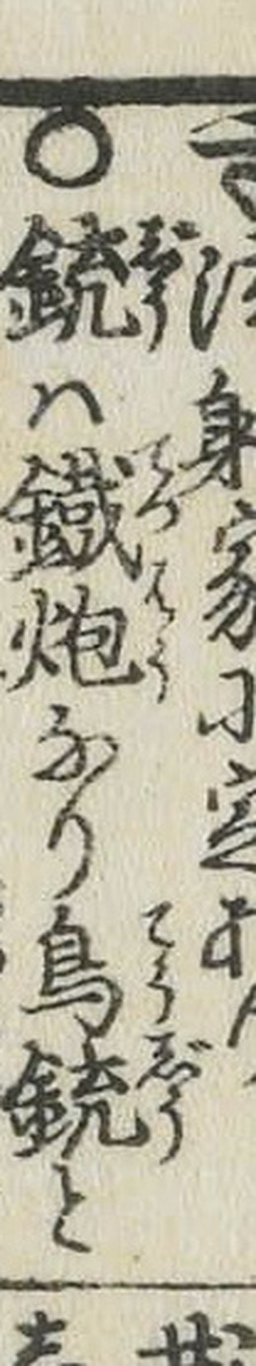○銃は鉄炮なり鳥銃と
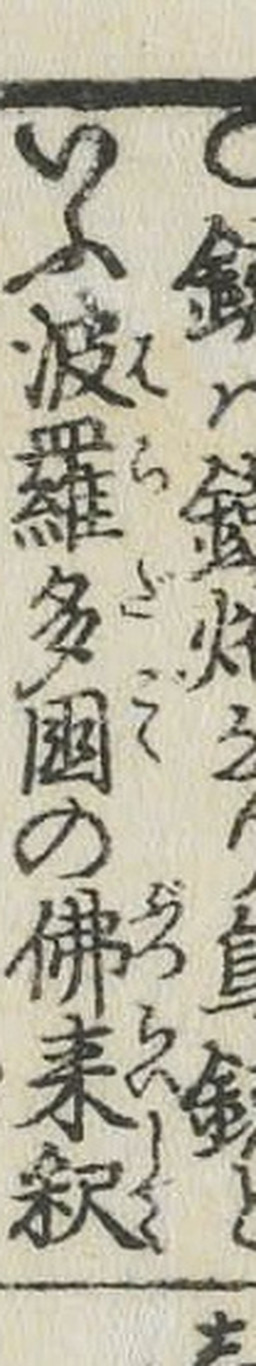いふ波羅多国の仏来釈
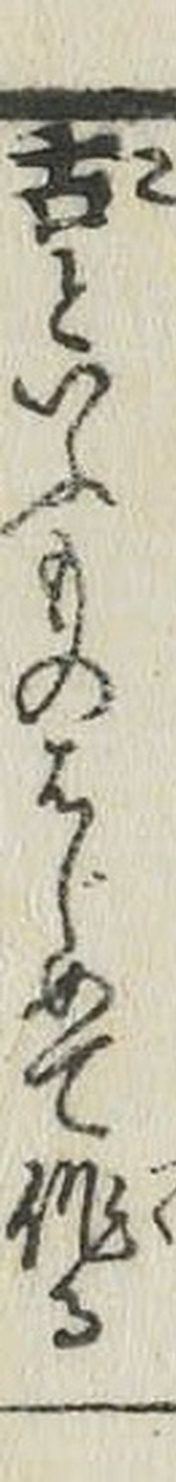古といふものはじめて作る
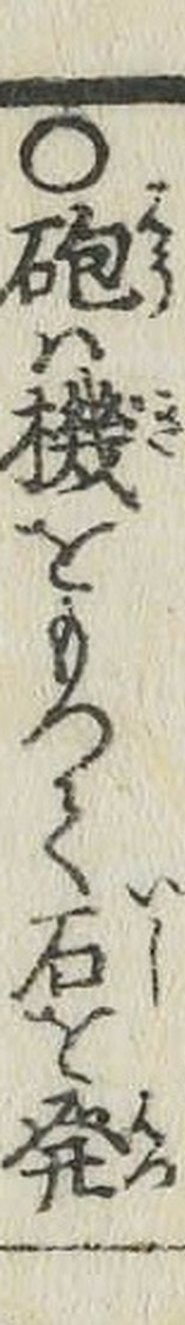○砲は機をもつて石を発
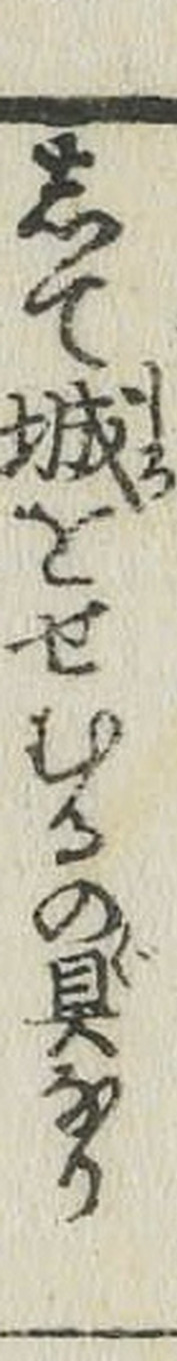して城をせむるの具なり
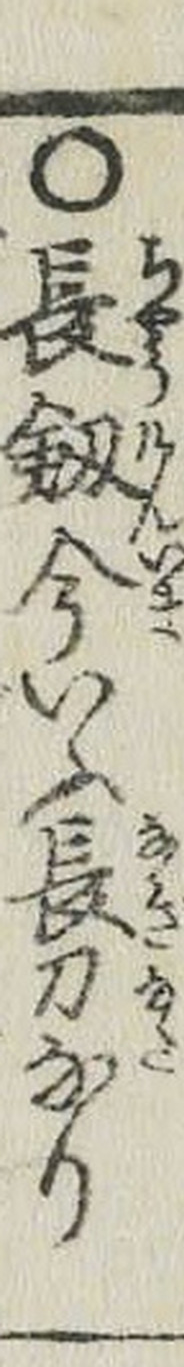○長剣今いふ長刀なり
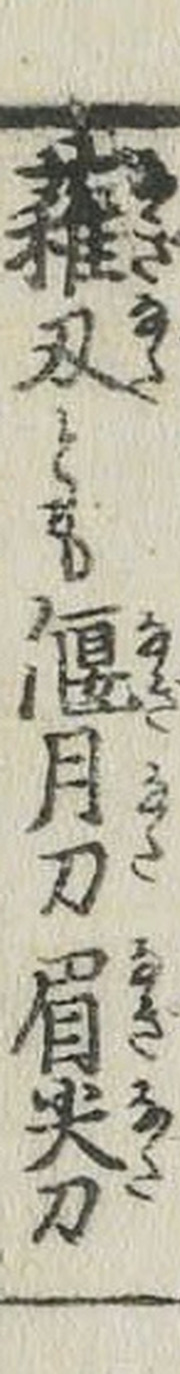薙刀とも偃月刀眉尖刀

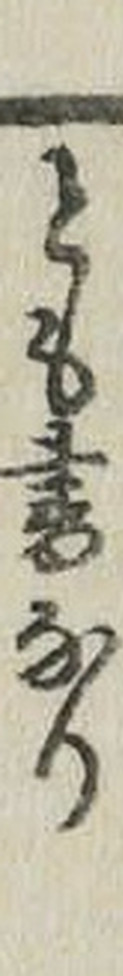とも書なり
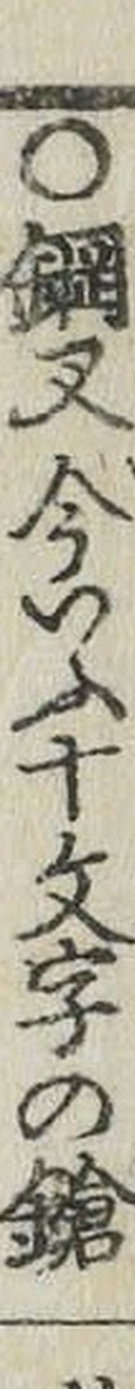○鋼叉今いふ十文字の鎗
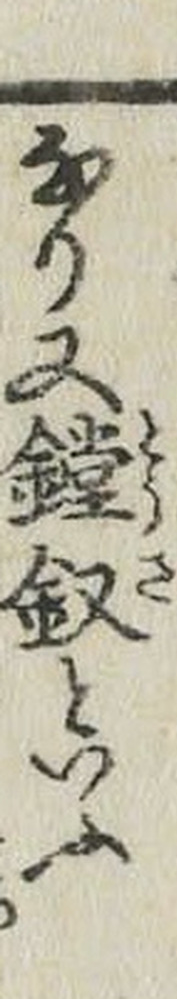なり又鐺釵といふ
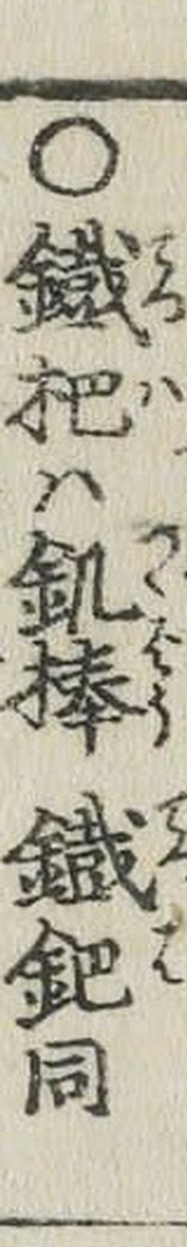○鉄把は釩棒鉄鈀同
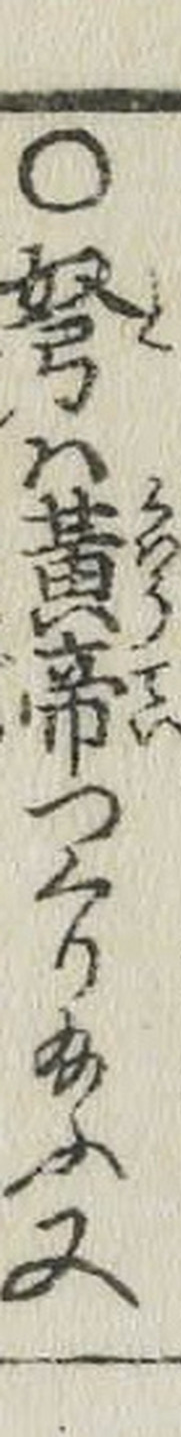○弩は黄帝つくり給ふ又
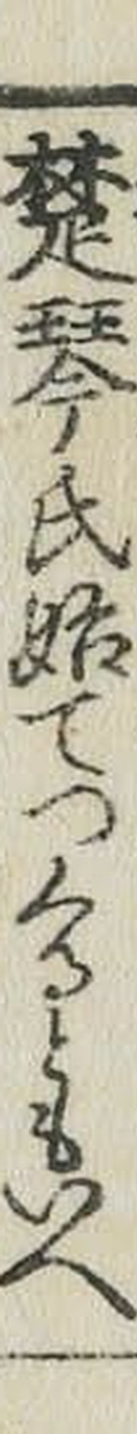楚琴氏始てつくるともいへ
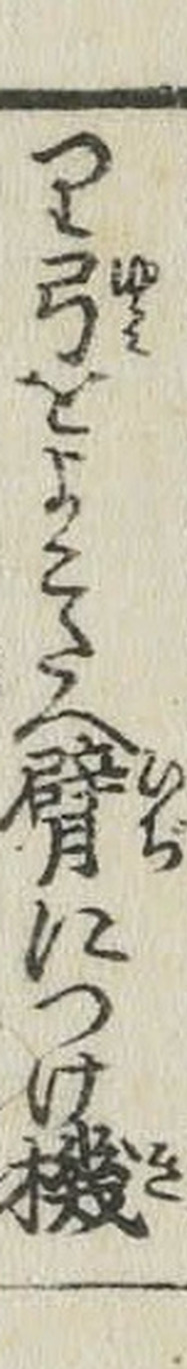り弓をよこたへ臂につけ機
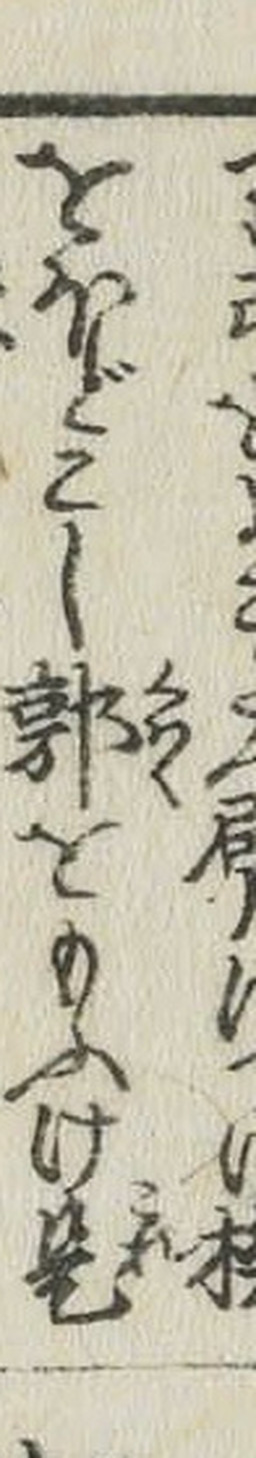をほどこし郭をもふけ是
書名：増補頭書訓蒙図彙大成 10巻 5:巻之9-11
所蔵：東京学芸大学教育コンテンツアーカイブ
